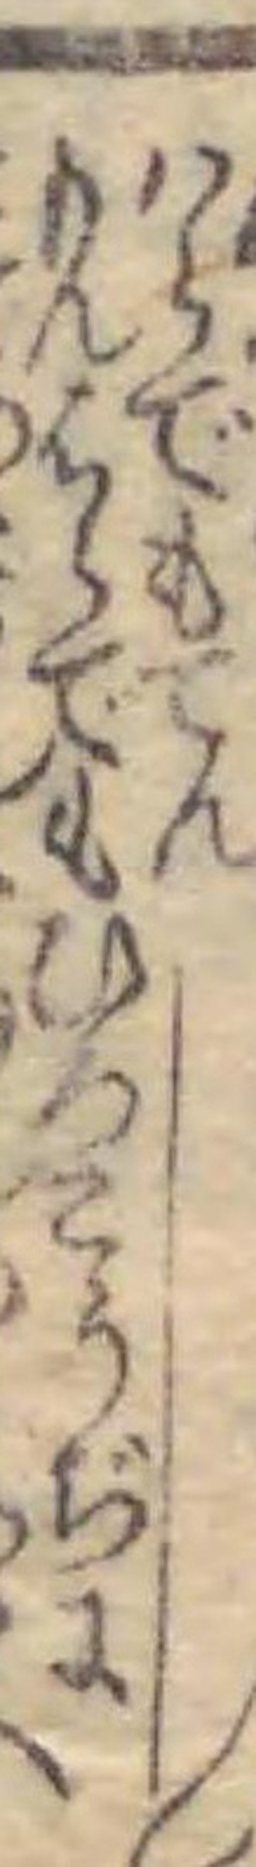もんはらでもひろこうぢに
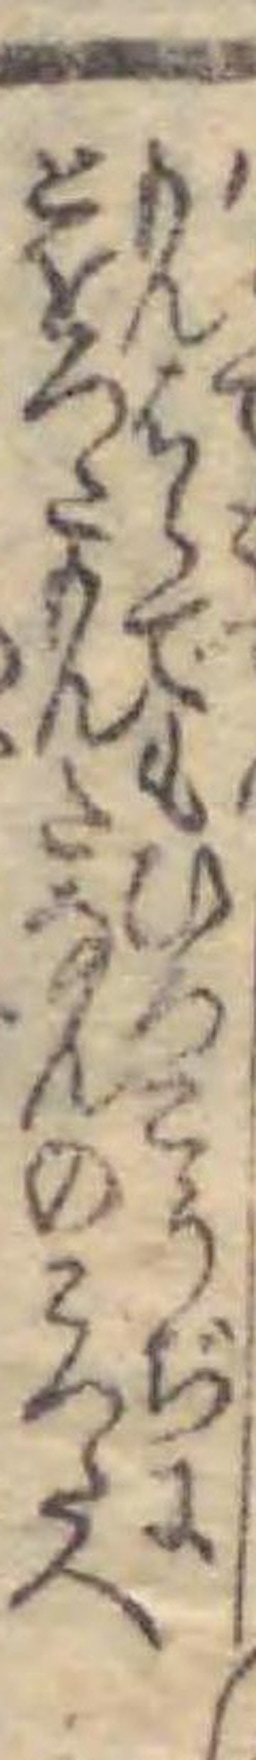とをつたもんたなんのこつたへ
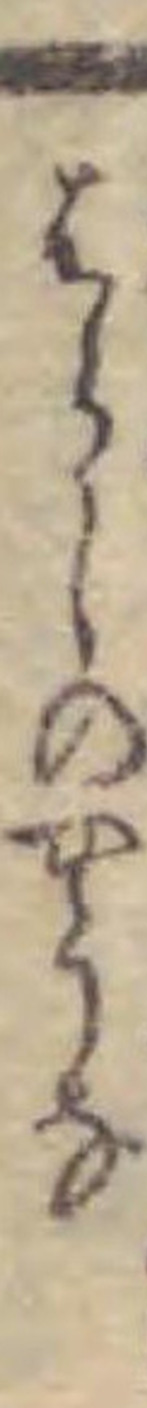はらしのやうな
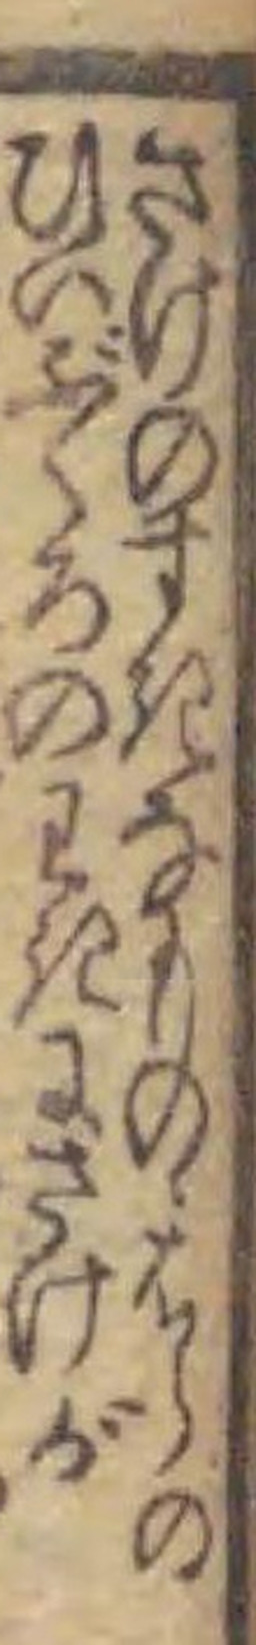ひいぶくろのわきにさけが
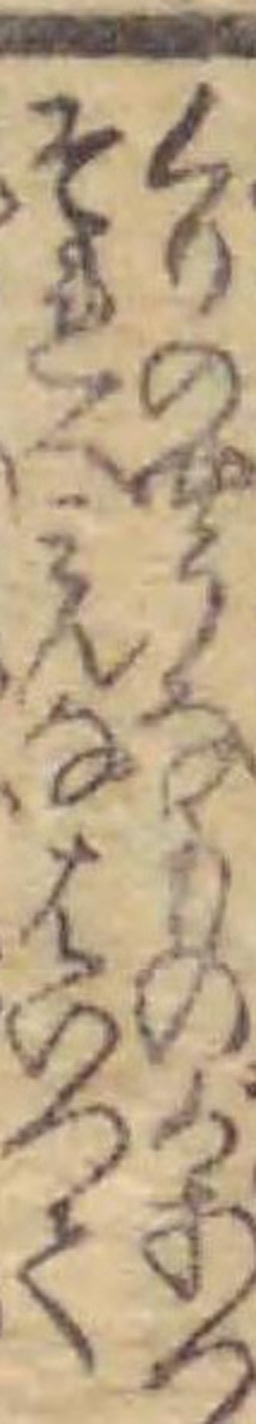それへみんなはいつて
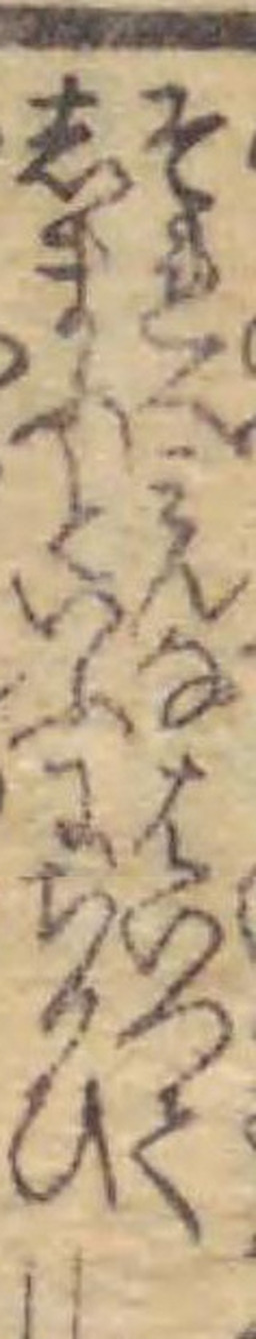しまふといふにちかひ
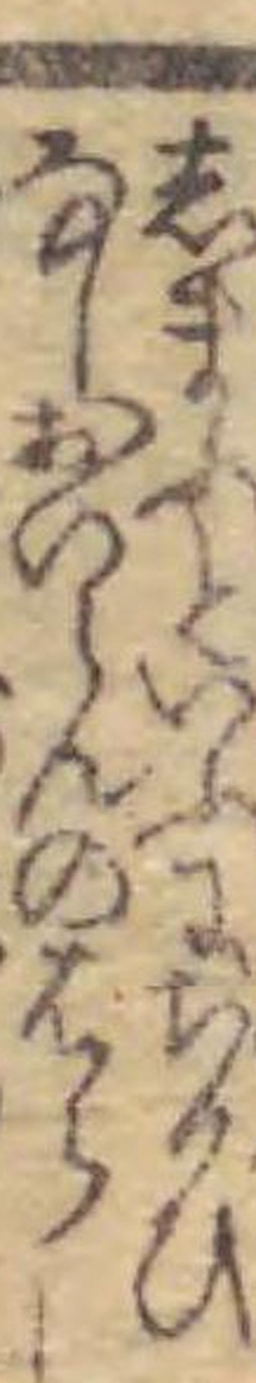なしおいらんのはら
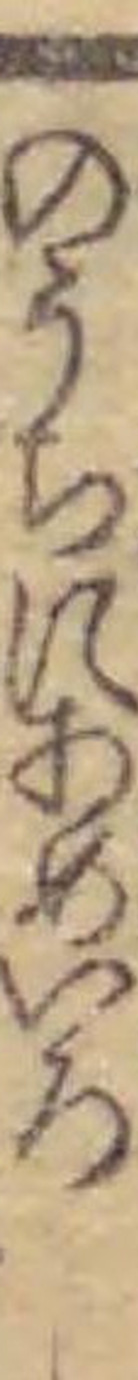のうちにあめいろ
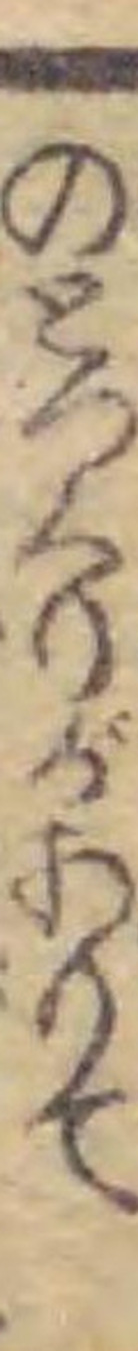のとつくりがありて
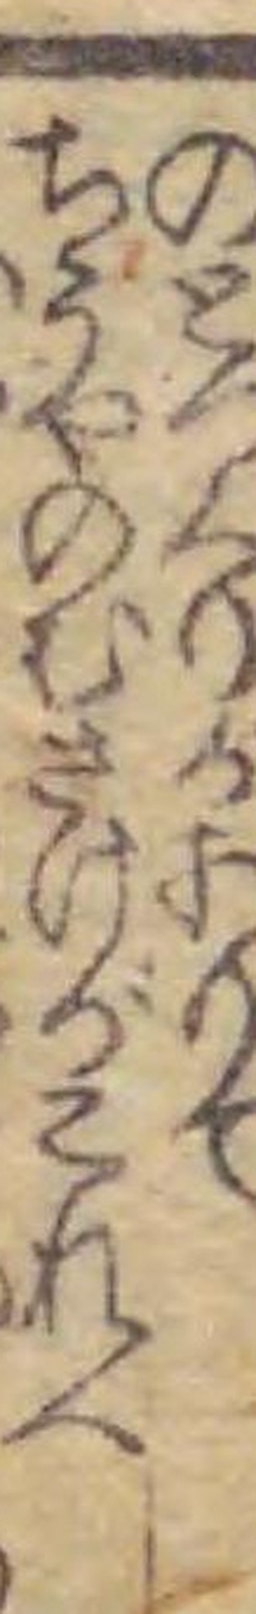ちうやのむさけがこれへ
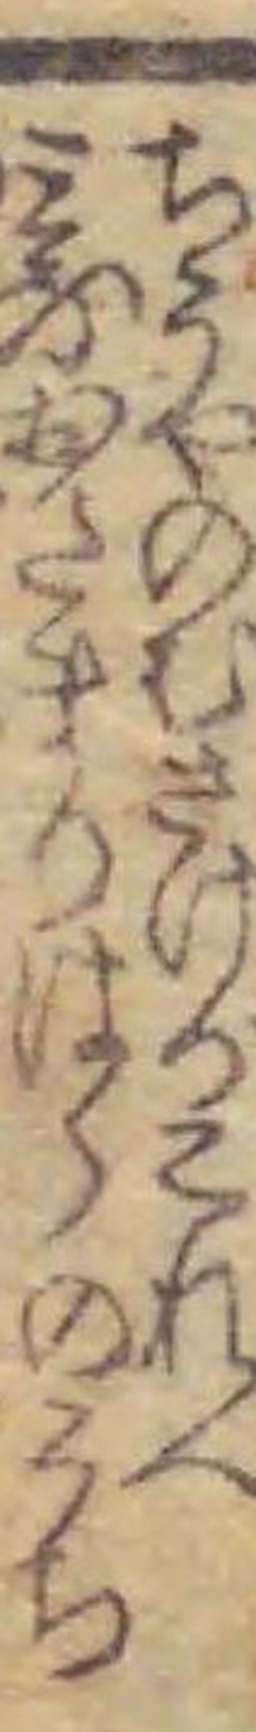みなおさまりはらのうち
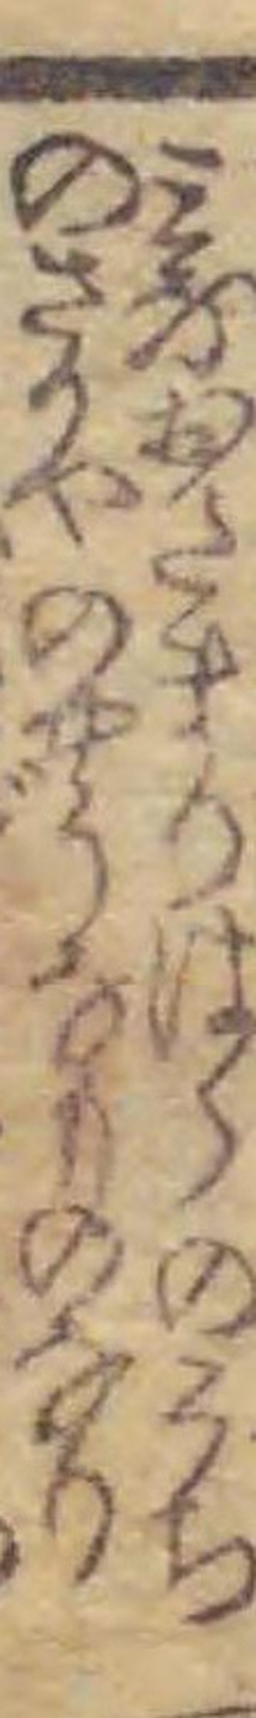のさかやのやうなものなり
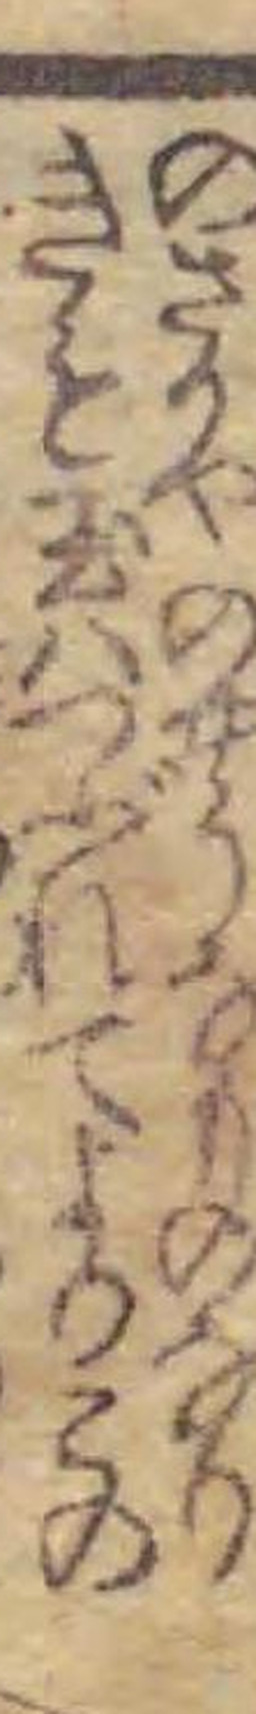きも玉はつぶれてよりこの
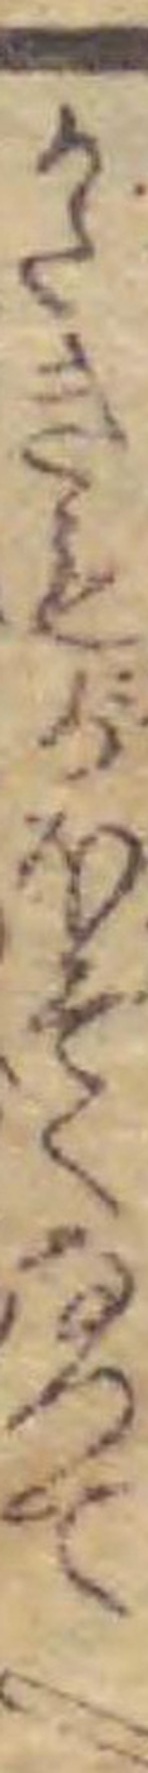かたきもがほそくなつて
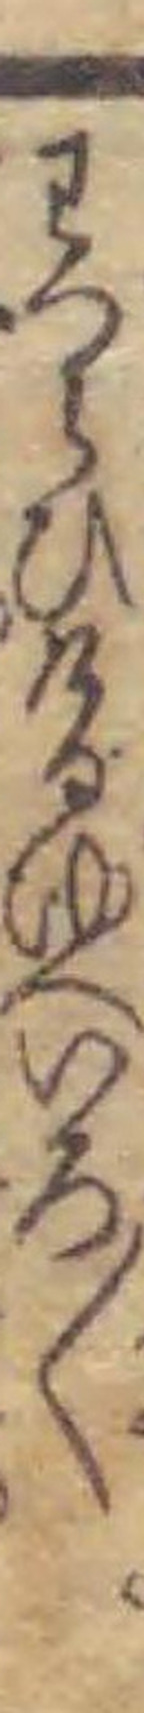わつらひけるゆへいろ〳〵
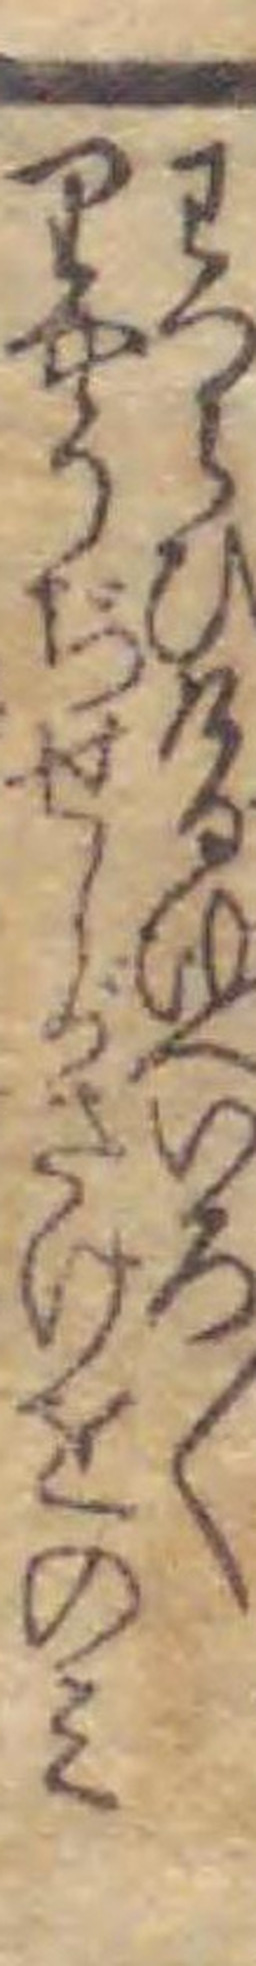りやうぢせしがさけをのみ
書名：十四傾城腹之内 : 3巻
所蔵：国立国会図書館 National Diet Library, JAPAN
